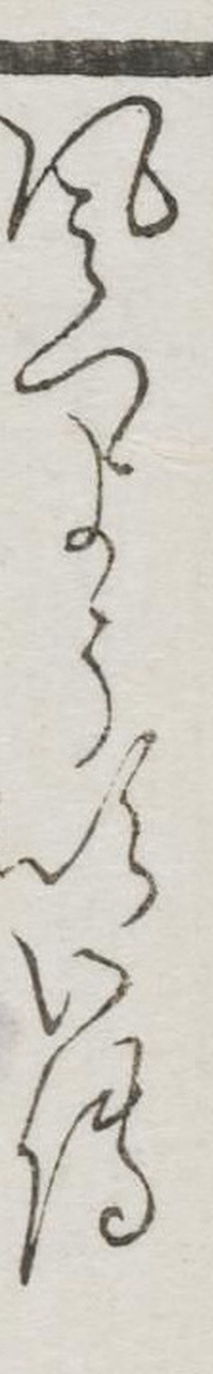風つよう吹いて
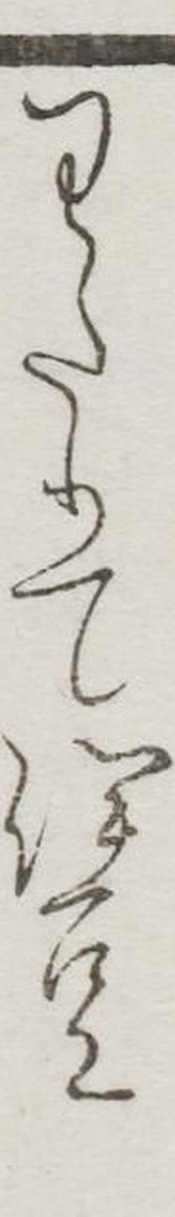わたりて伊豆
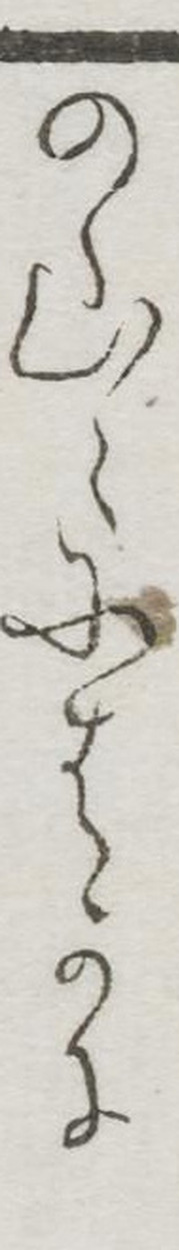の山々にはかに
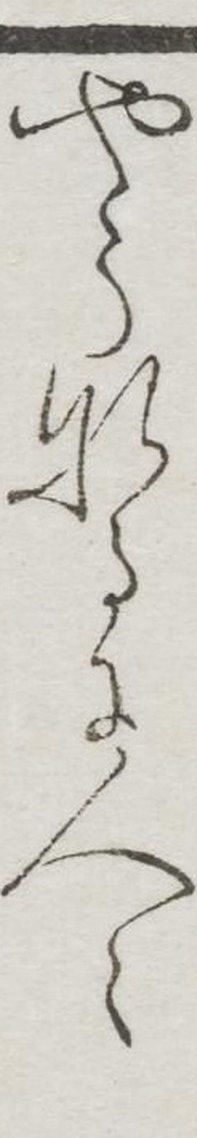やうなるに人々
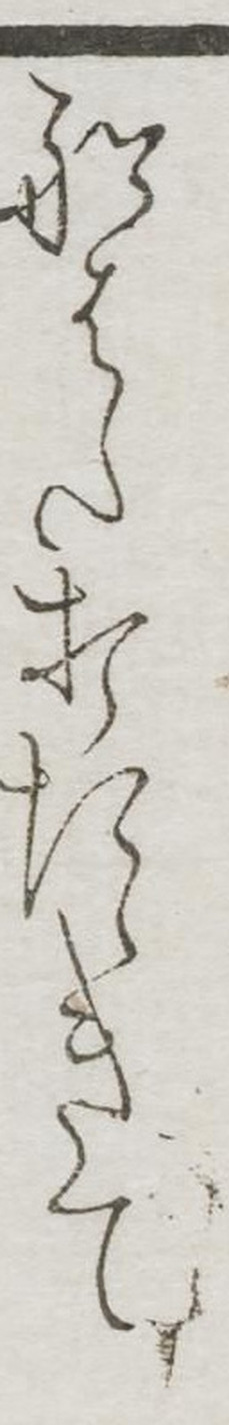船はた打たゝきて
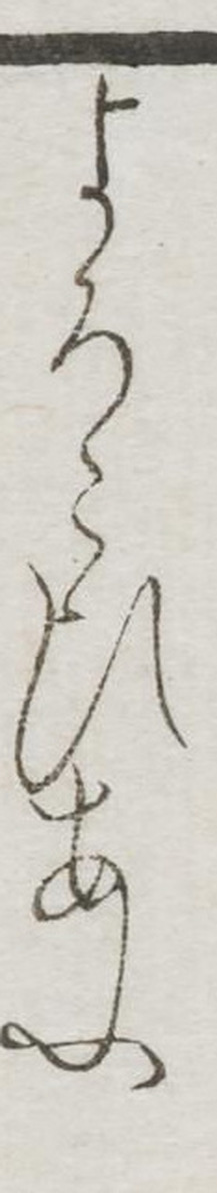よろこひあふ
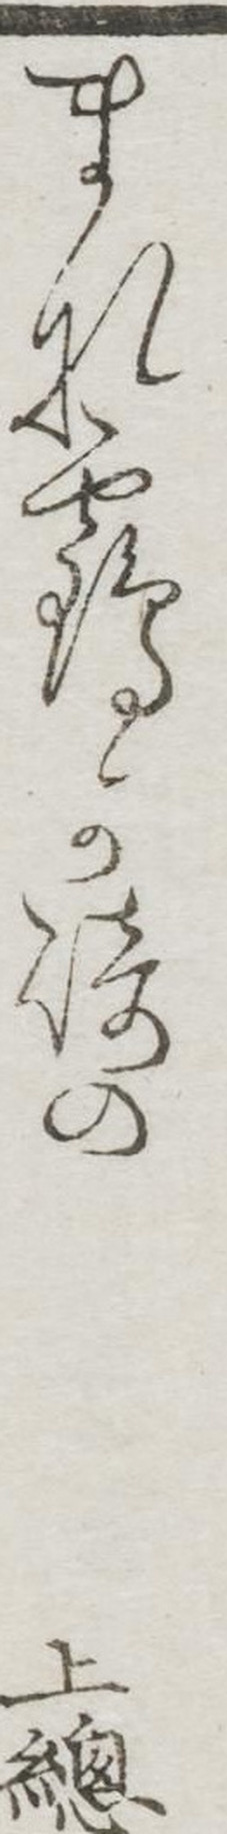まな靎か崎の上總
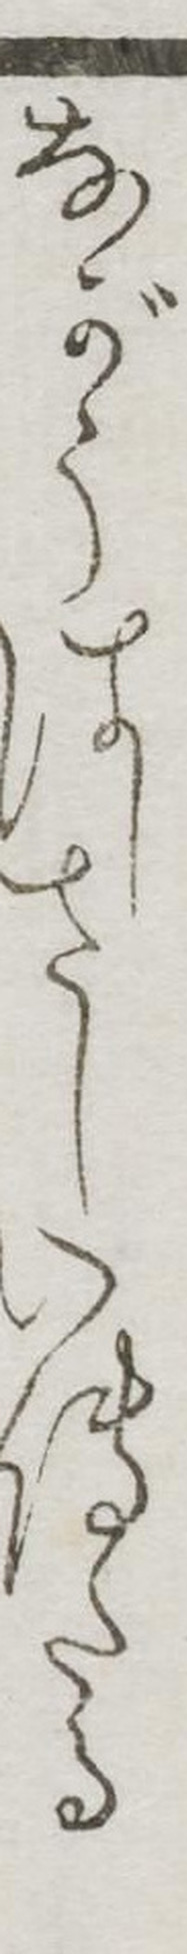ながうはさしいてたる
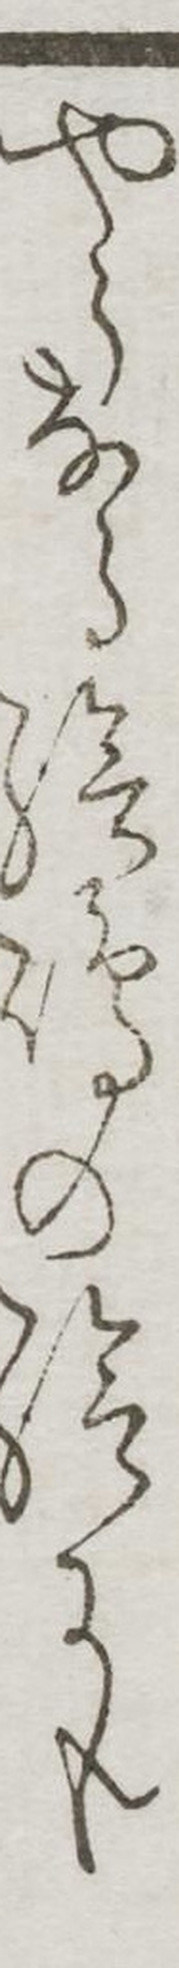やうなる絵嶋の絵にも

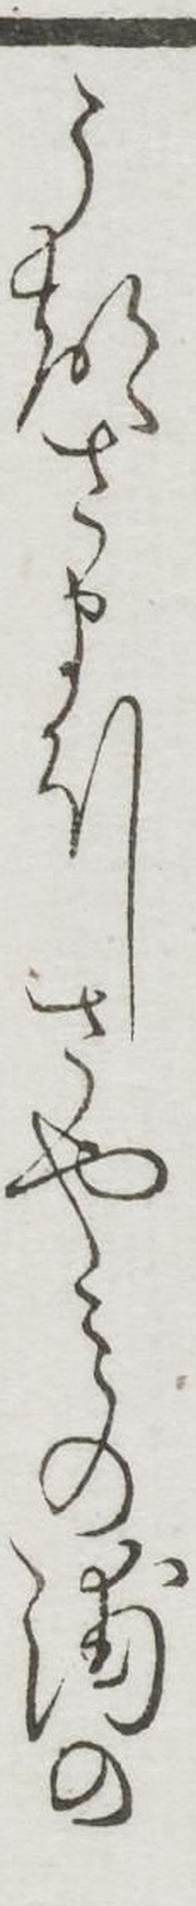うるさまほしさやみの浦の
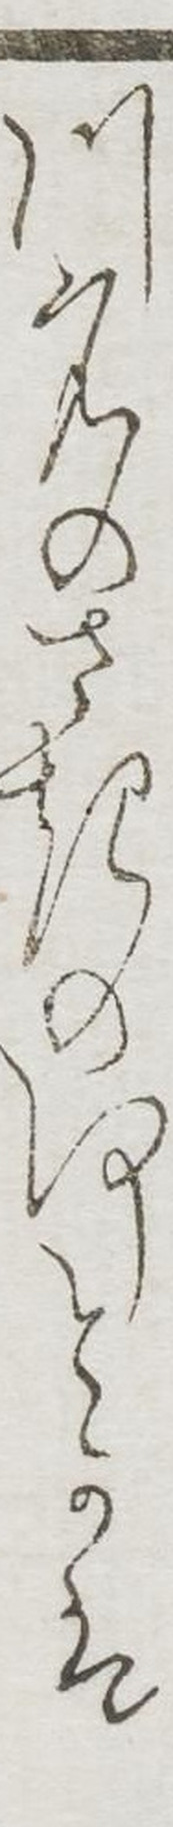川名のさきの何とかは
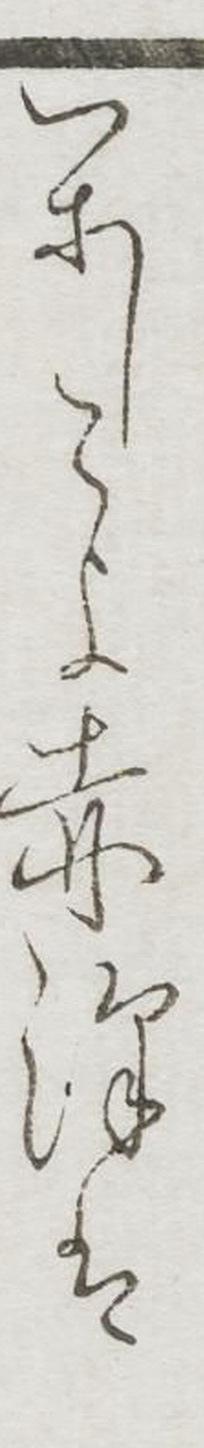かしこに赤沢は
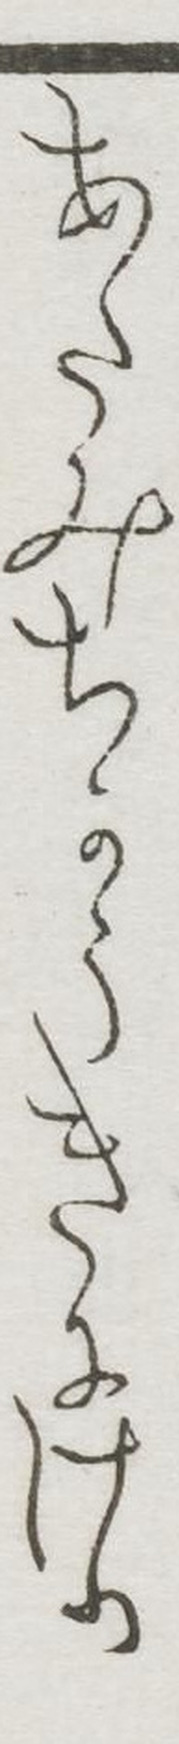あたみちかうきにけり
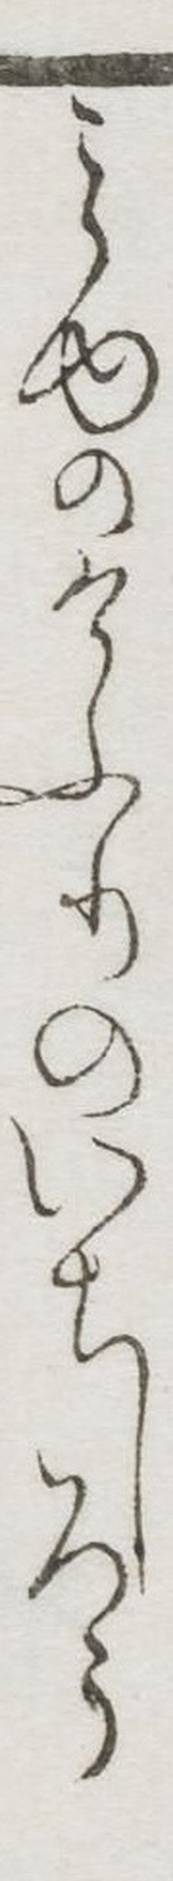みゆのけふりのいちしろう
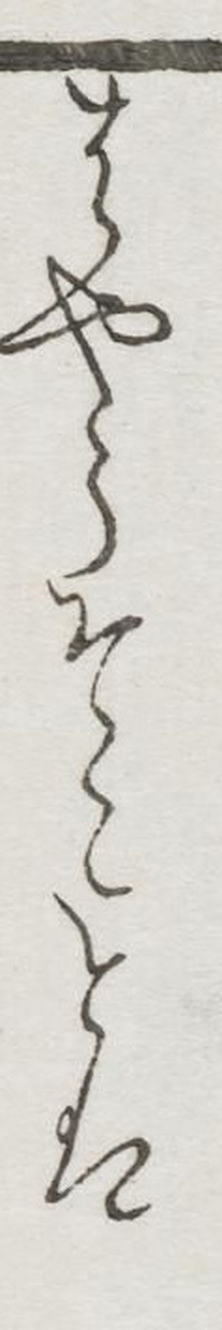はやうそことは
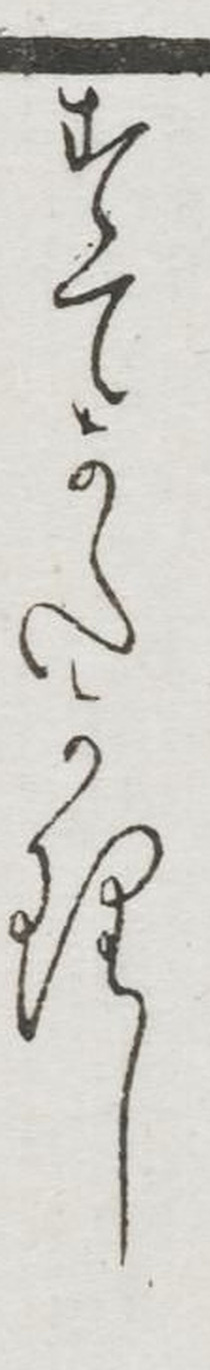すてかたかりし
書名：挿画熱海日記　全
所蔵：東京大学地震研究所図書室 Earthquake Research Institute Library, The University of Tokyo, JAPAN
